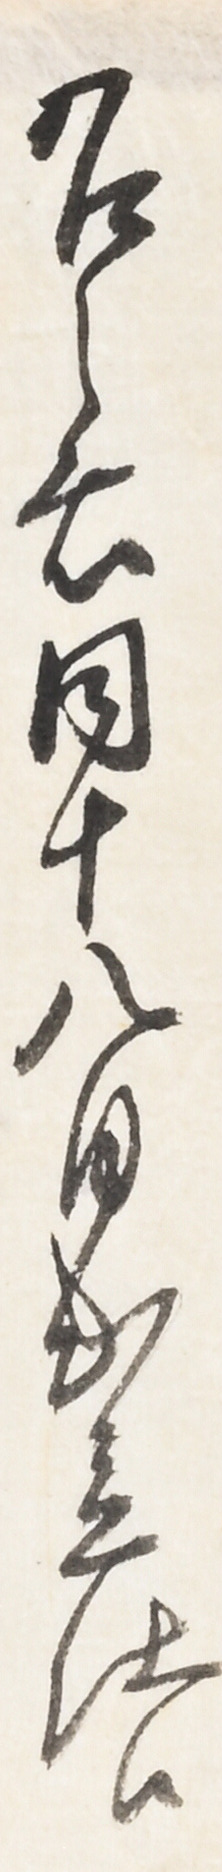右之者同十八日出立仕候
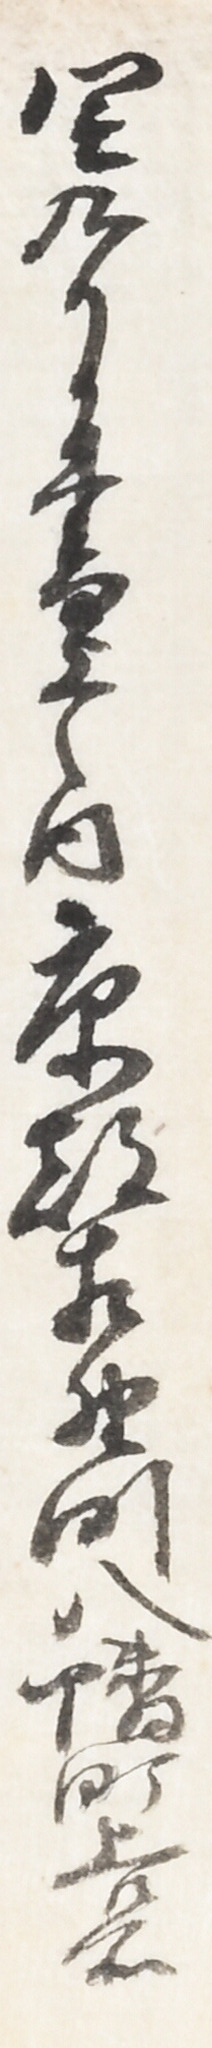閏九月書上之内京都相野町八幡町上ル所
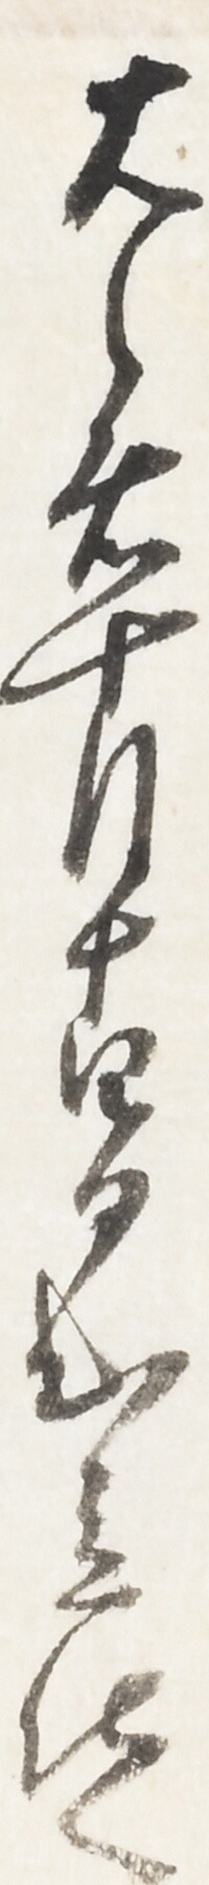右之者十月十四日出立仕候
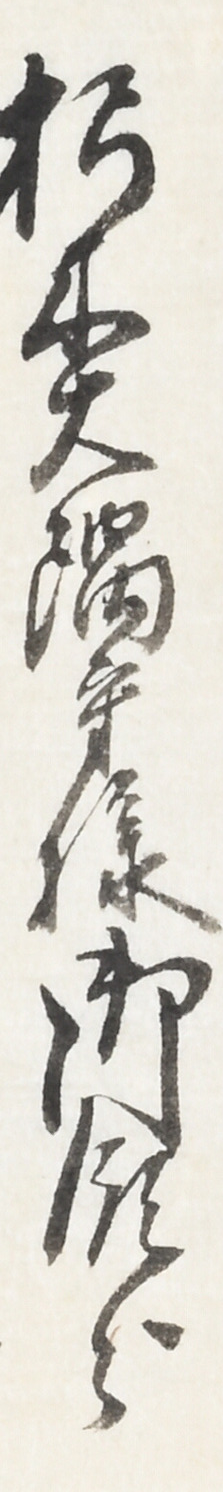朽木大隅守様御領分
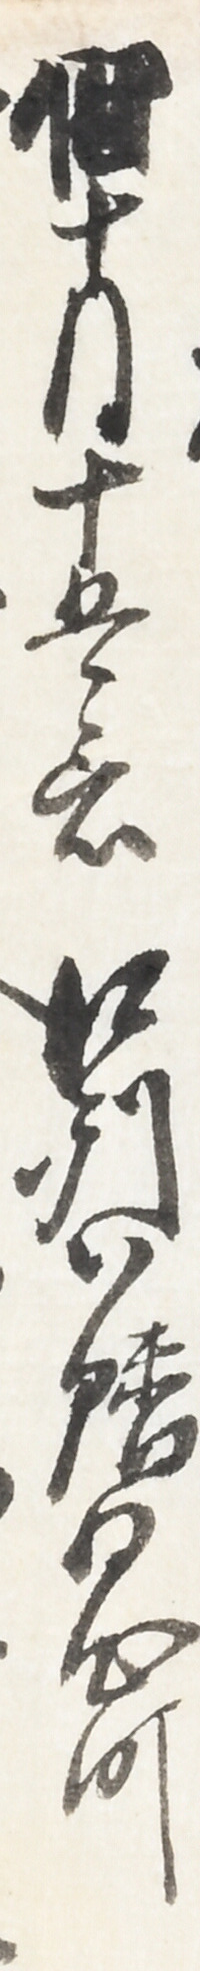十月十五日着江州八幡同心町
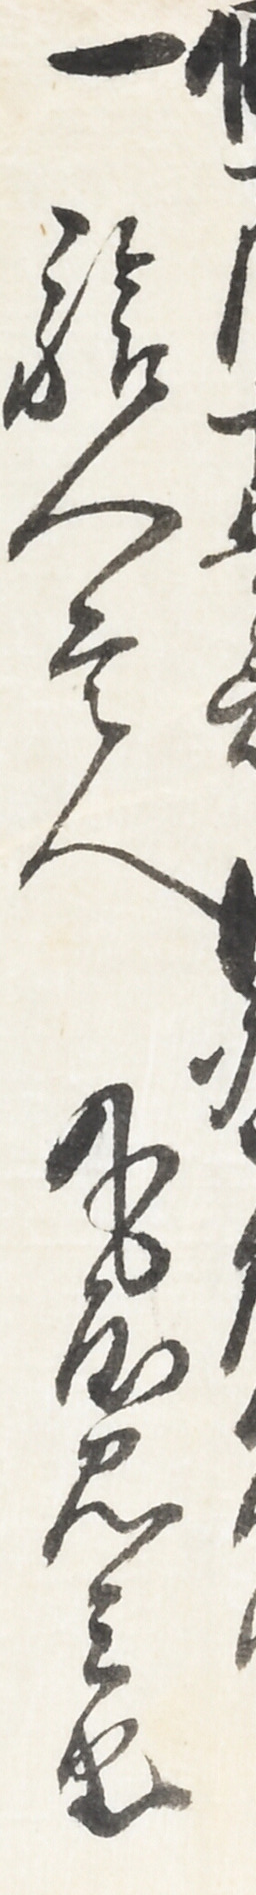一旅人壱人丸尾忠兵衛
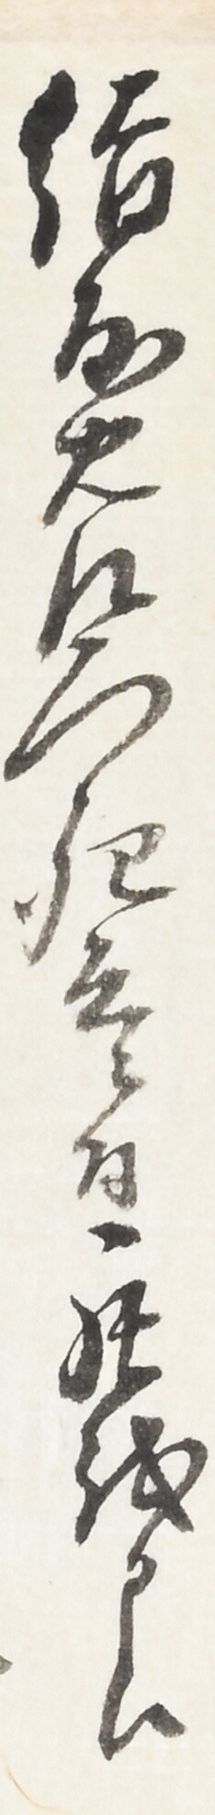絹屋忠左衛門死去ニ付罷越申候
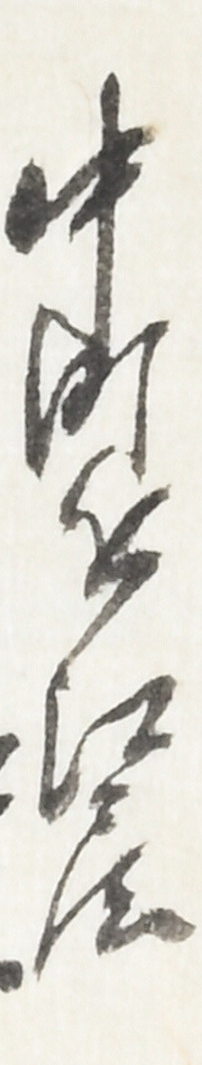中町近江屋
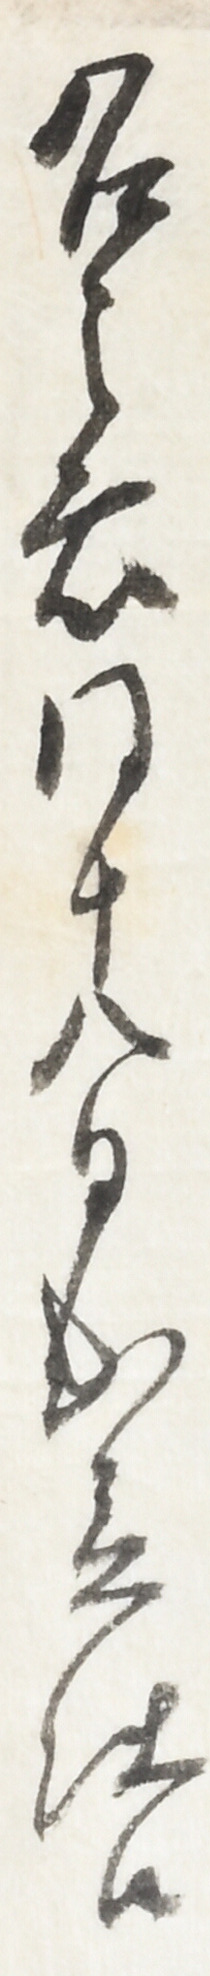右之者同十八日出立仕候

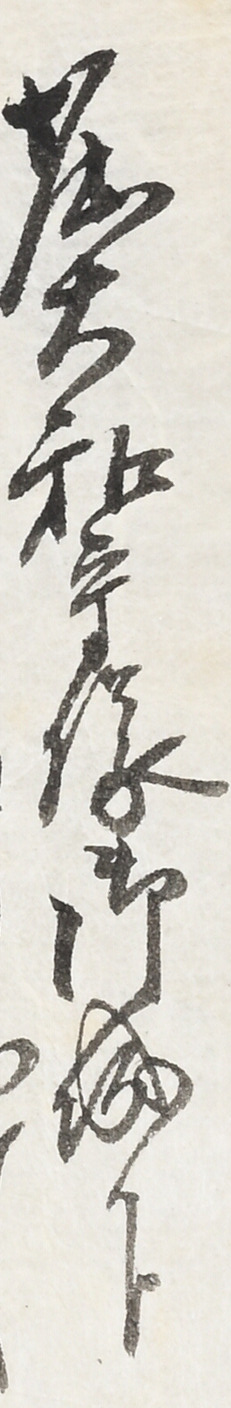堀大和守様御城下
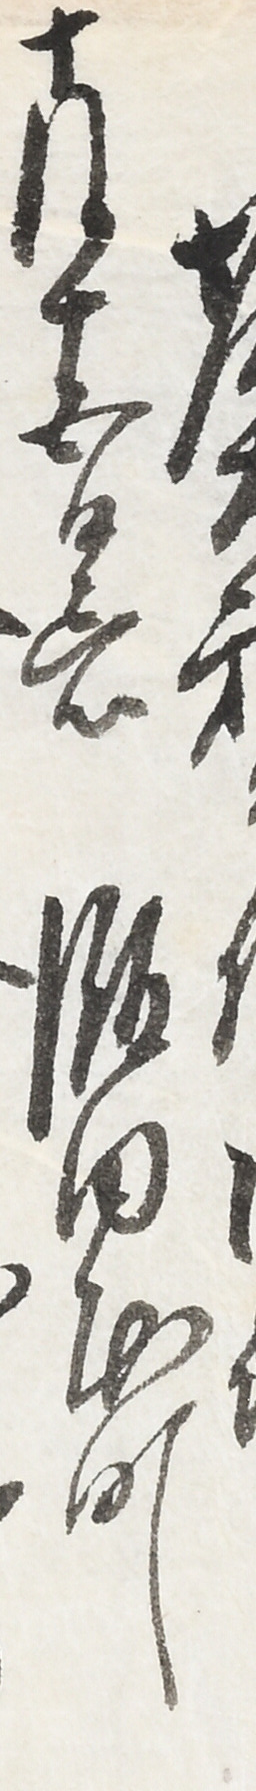十月十五日着飯田本町
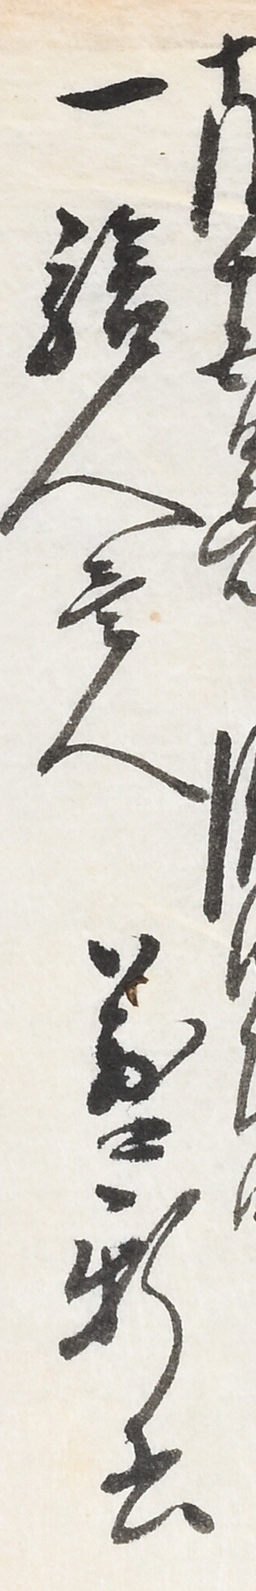一旅人壱人万や新六
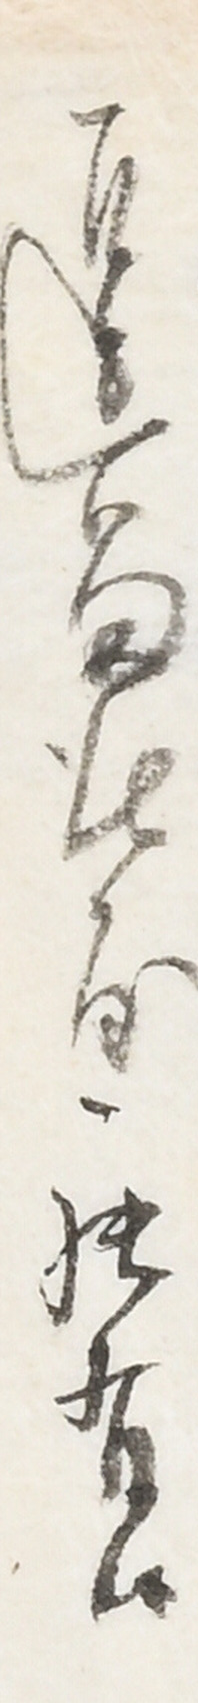逗留仕度罷有候
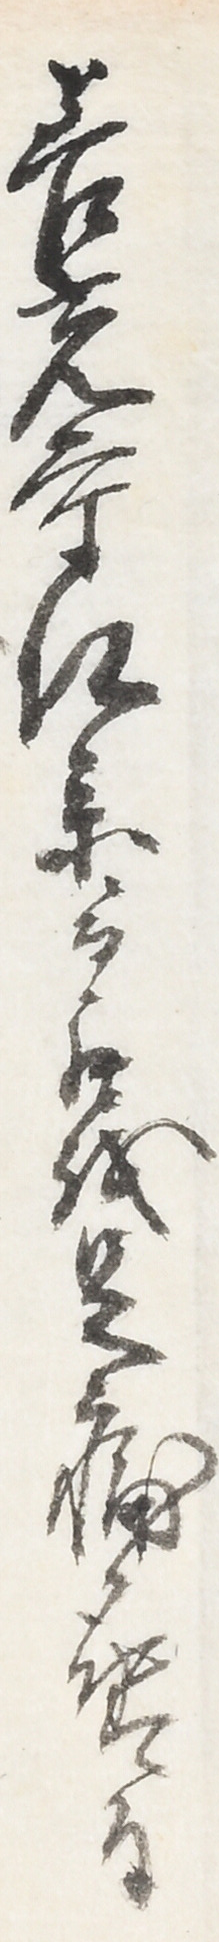善光寺江参ニ而罷越足痛御座候ニ付
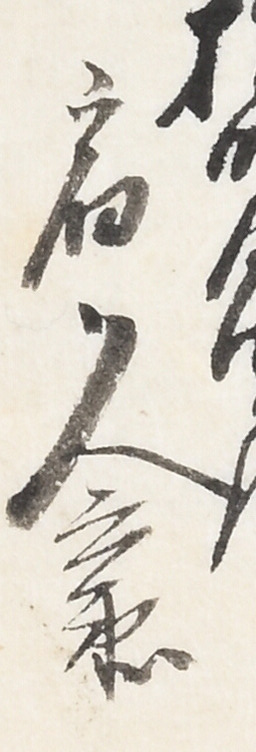宿久兵衛
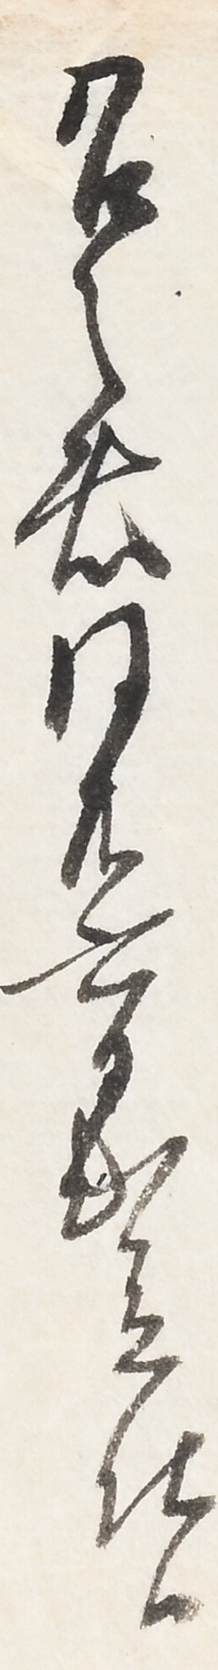右之者同廿肋日出立仕候
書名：旅人泊控帳
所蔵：伊那市立高遠町図書館・合同会社AMANE
